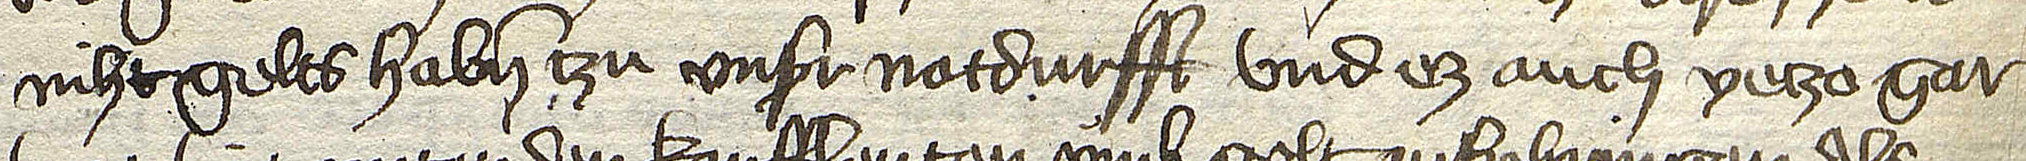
niht gelts habn* cʒu vnſ*r notdurfft vnd eʒ auch yecʒo gar
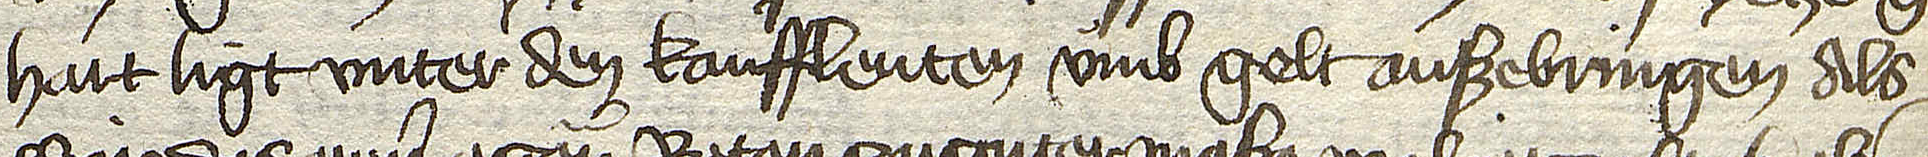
hart ligt vnter den kauffleuten v̈mb gelt auſʒebringen Als
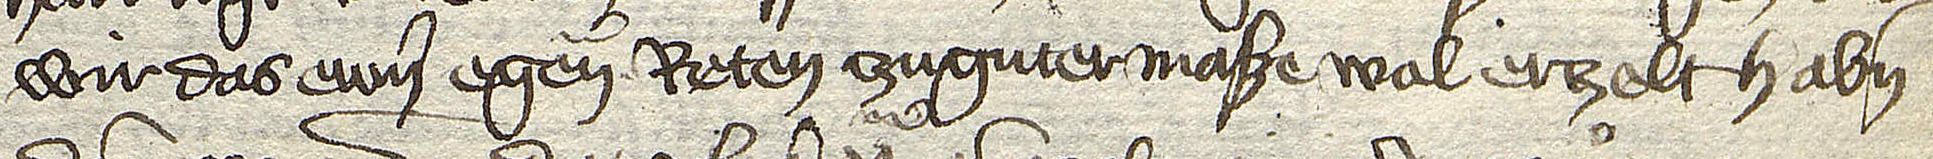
wir das ewn* egen* Reten cʒuguter maſʒe wol ercʒelt habn*
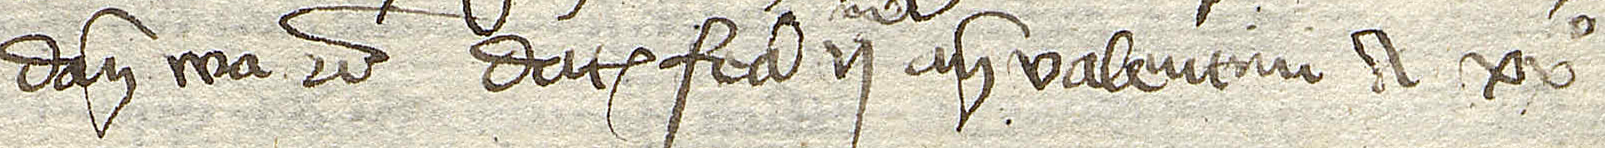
dan* wo ec* Dat* fea* ii* an* valentini A xx*
